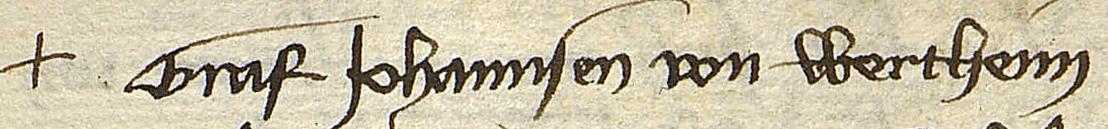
+ Graf Iohannſen von Wertheim
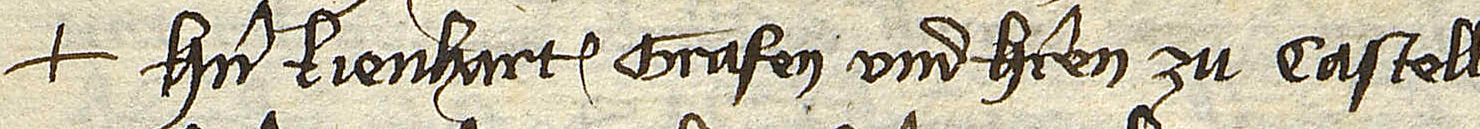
+ H*n Lienhart* Grafen vnd h*ren ʒu Caſtell
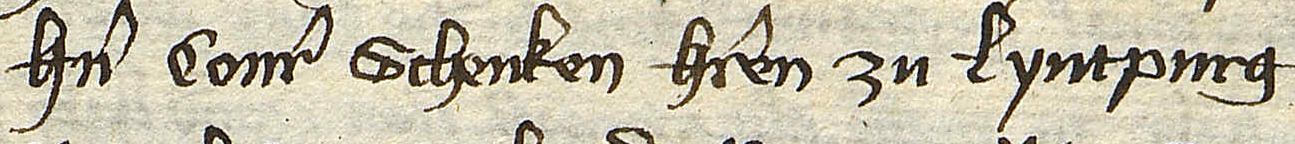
H*n Conr* Schenken h*ren ʒu Lyntpurg
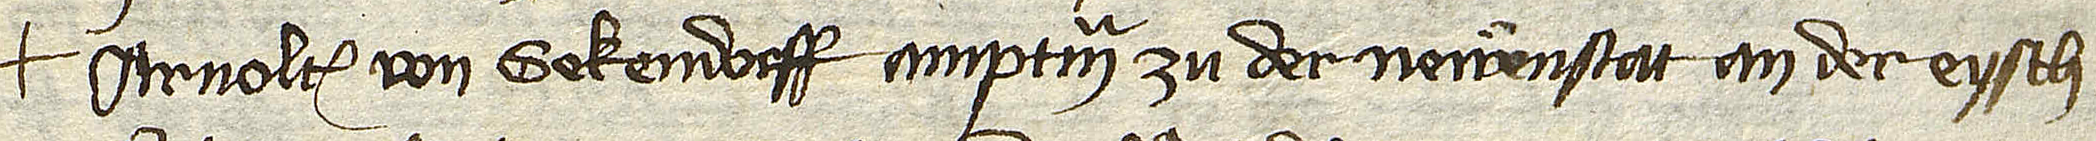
+ Arnolt* von Sekendorff amptm* ʒu der newenſtat an der eyſch
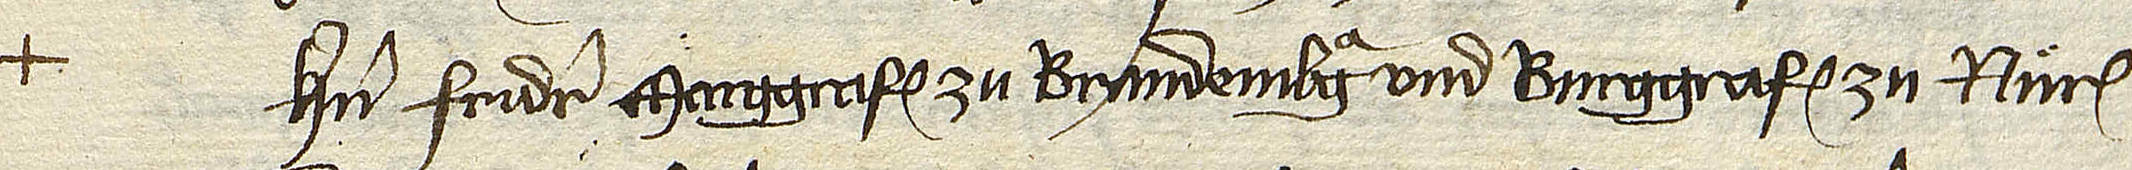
+ H*n fridr* Marggraf* ʒu Brandemb*g vnd Burggraf* ʒu Nür*
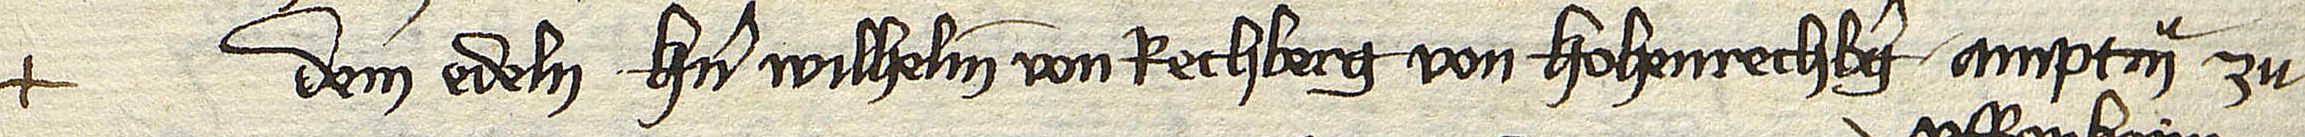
+ Dem edeln h*n wilhelm* von Rechberg von hohenrechb*g / amptm* ʒu
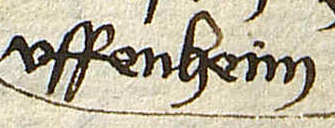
vffenheim
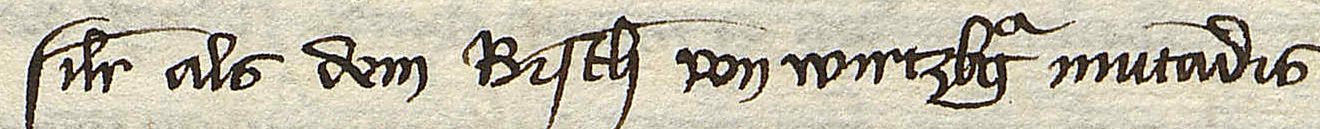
ſilr als dem Biſch* von wircʒb*g muta*dis
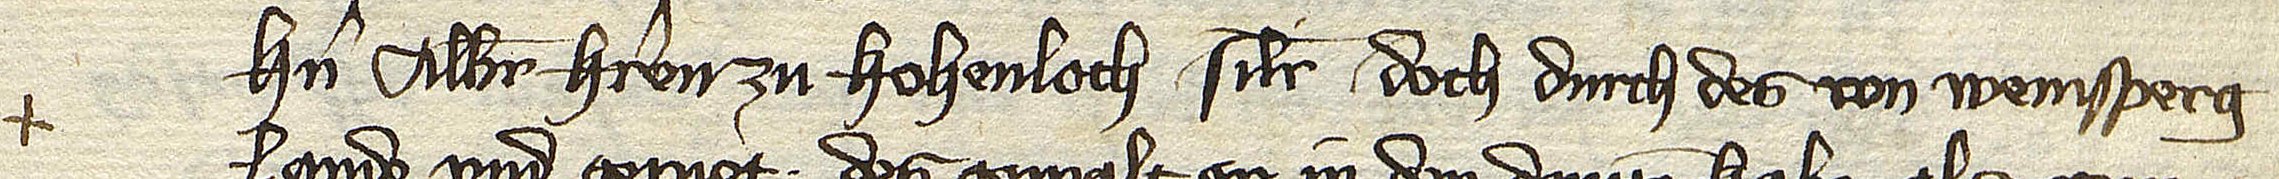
+ H*n Albr* h*ren ʒu hohenloch ſilr / doch durch des von weinſperg
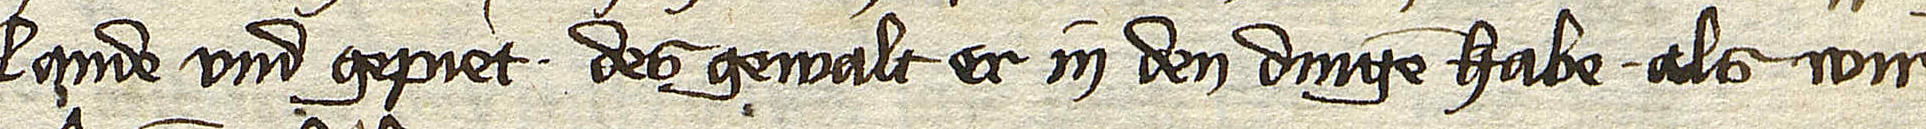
lande vnd gepiet . des gewalt Er in den dinge* habe . als wir
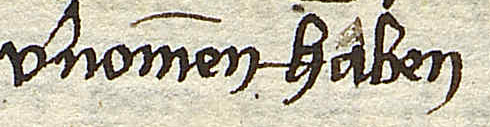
v*nom*en haben
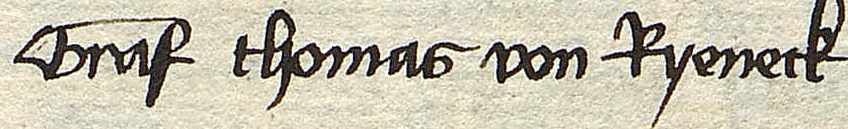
Graf thomas von Ryeneck
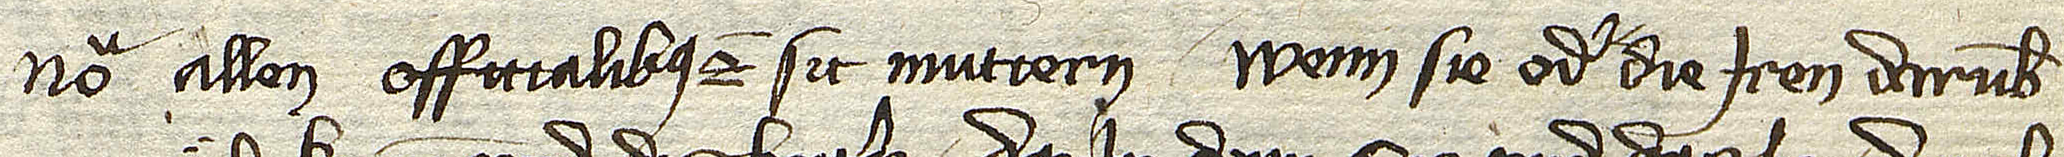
no* allen officialib* @ ſic mutiern / wenn ſie od* die Iren daru*b
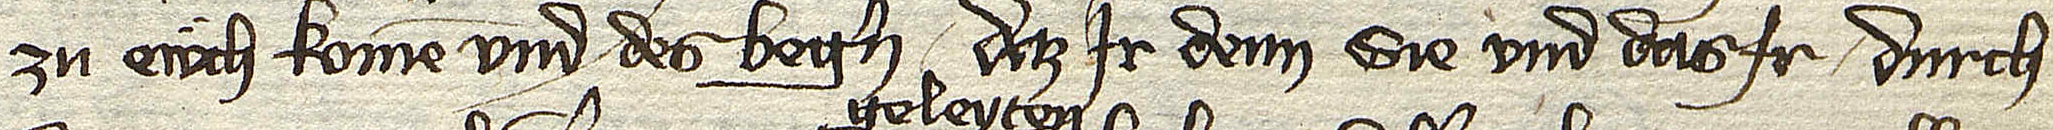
ʒu ewch kome* vnd des beg*n / daʒ Ir denn Sie vnd das Ir / durch
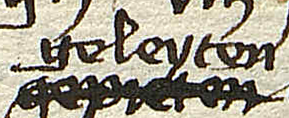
geleyten
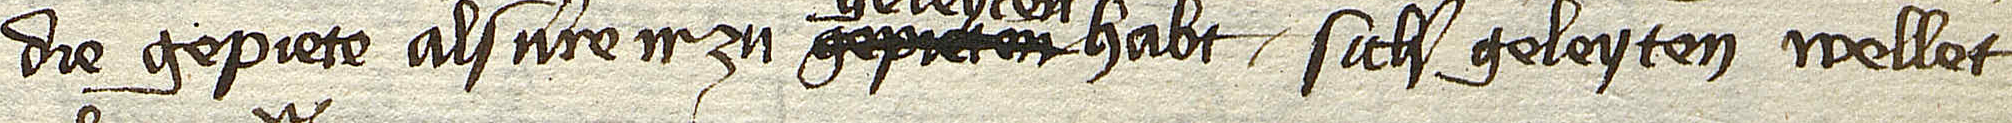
die gepiete alſu*re ir ʒu gepieten habt / ſich* geleyten wellet
